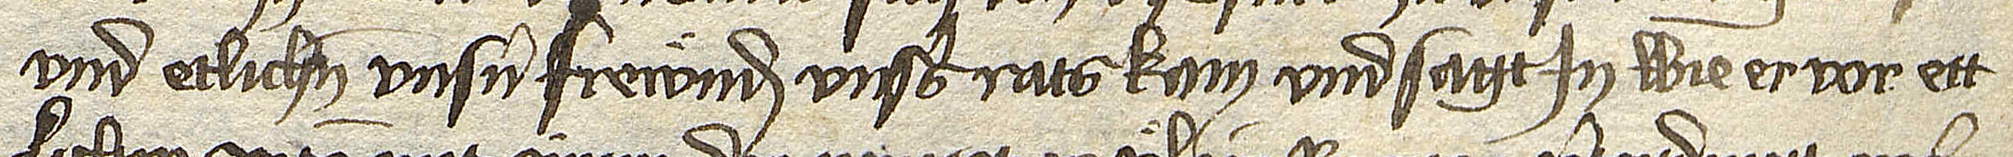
vnd etlichn* vnſn* freẅnd* vnſ*s rats kann vnd ſagt In wie er vor ett =
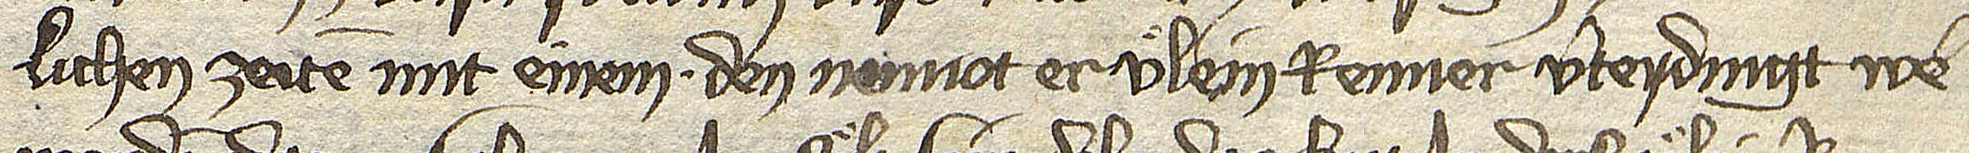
lichen ʒeite* mit einem . den nennet er v̈lein Renner v*teydingt w*e
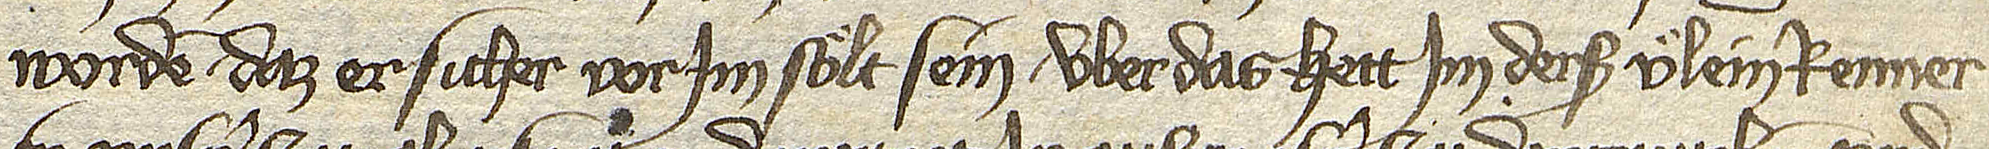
worde* / daʒ er ſicher vor Im ſölt ſein / Vber das hett Im derſ* v̈lein Renner
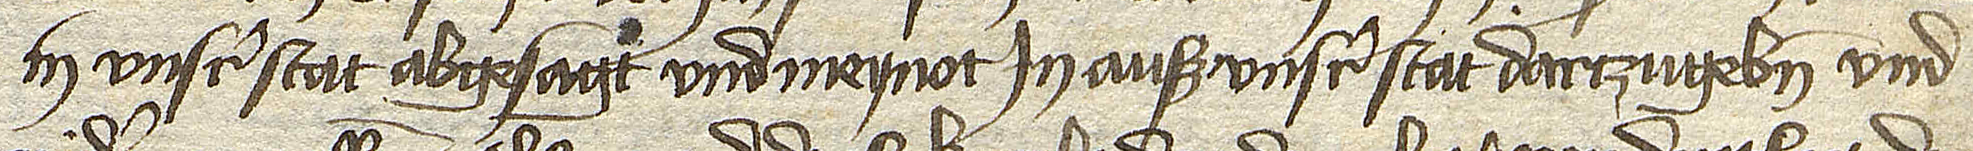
in vnſr* ſtat abgeſagt vnd meynet In auſʒ vnſr* ſtat darcʒugebn* vnd
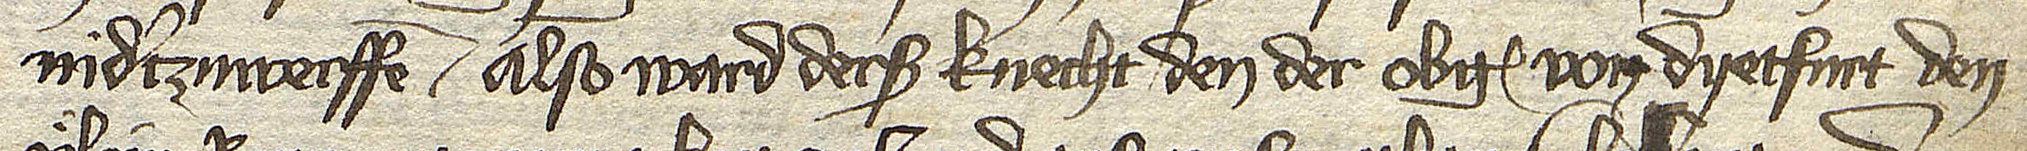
nid*cʒuwerffe* / Alſo ward derſ* knecht den der obg* von dyetfurt den
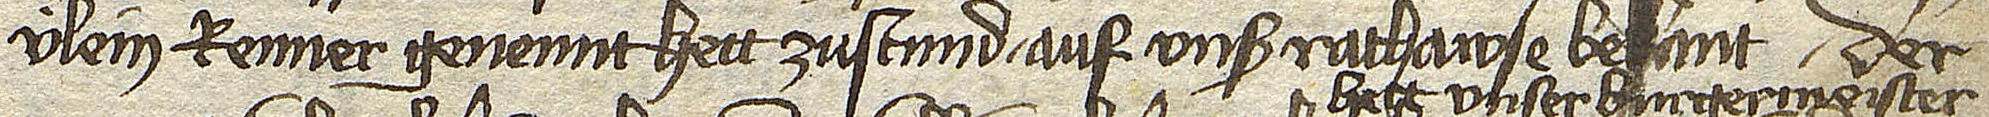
v̈lein Renner genennt hett ʒuſtund / auf vnſ* rathawſe beſant / Der
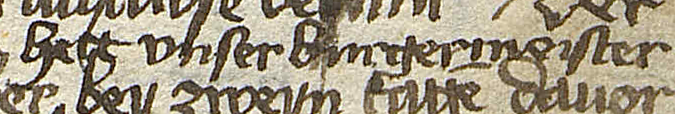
hett vnſer burgermeiſter
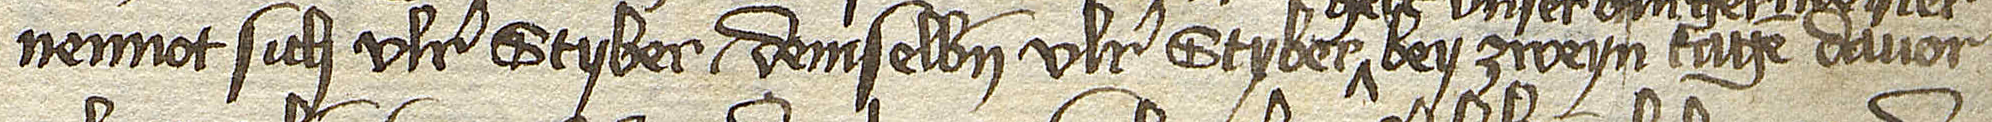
nennet ſich vlr* Styber / demſelbn* vlr* Styber bey ʒweyn tage* dauor
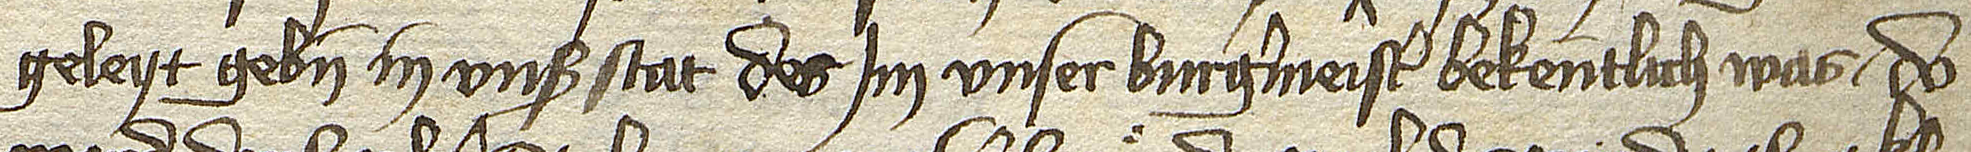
geleyt gebn* in vnſ* ſtat des Im vnſer burg*meiſt* beken*tlich was / Do
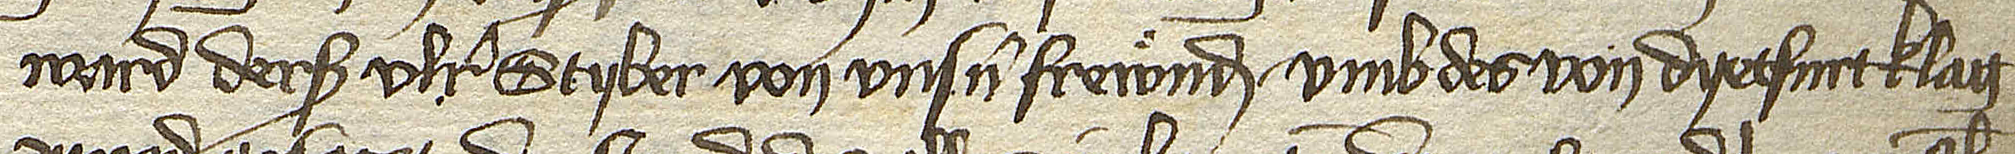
ward derſ* vlr* Styber von vnſn* freẅnd* / vmb des von dyetfurt klag
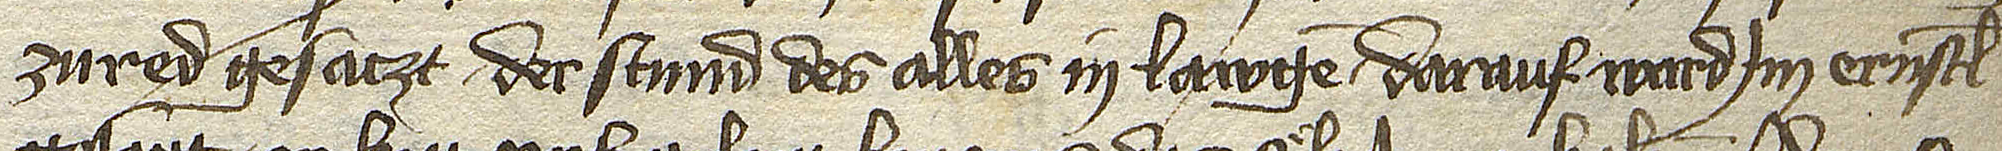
ʒured geſacʒt / der ſtund des alles in lawge* / Darauf ward Im ernſtl*
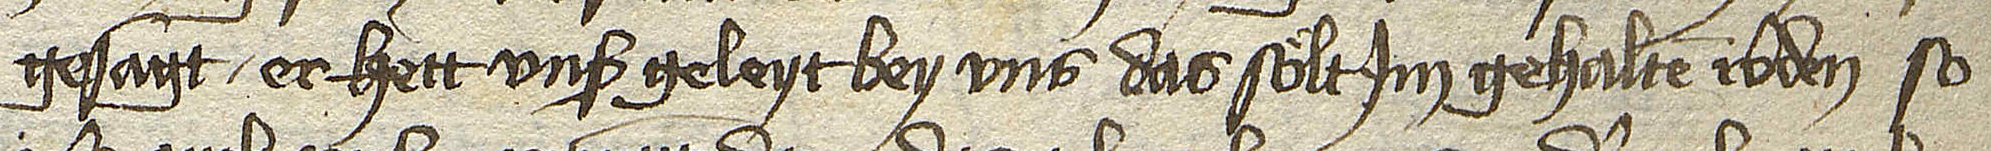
geſagt / er hett vnſ* geleyt bey vns das ſölt Im gehalte* w*den ſo
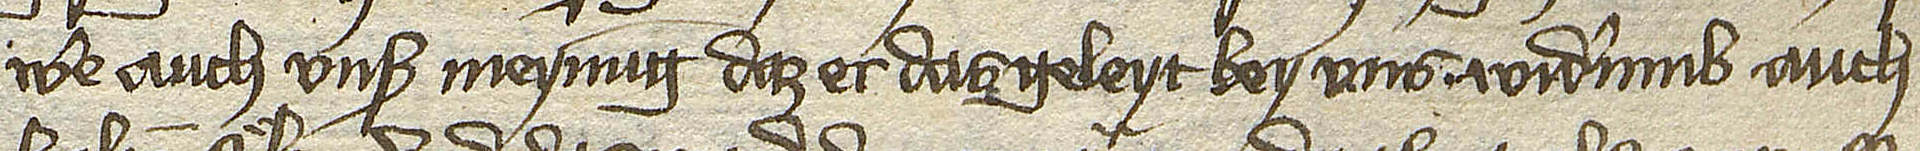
w*e auch vnſ* meynu*g daʒ er das geleyt bey vns wid*umb auch
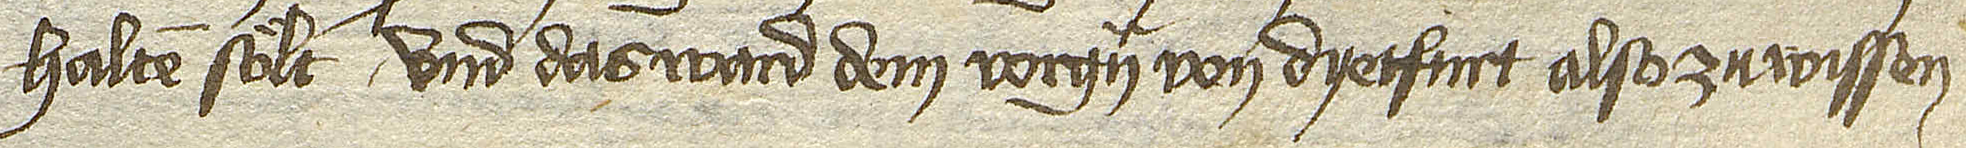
halte* ſölt / Vnd das ward dem vorgn* von dyetfurt alſo ʒuwiſſen
